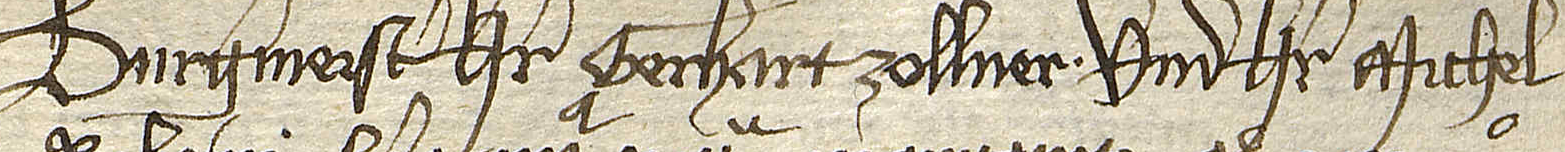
Burg*meiſt* Hr* Gerhart ʒollner . Vnd Hr* Michel
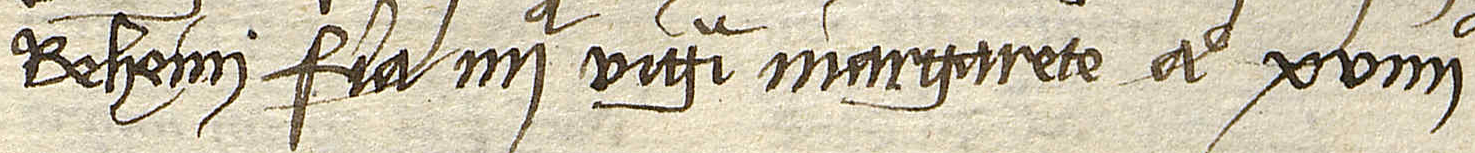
Beheim fi*a iiii* vigi* Margarete a* xviiii*
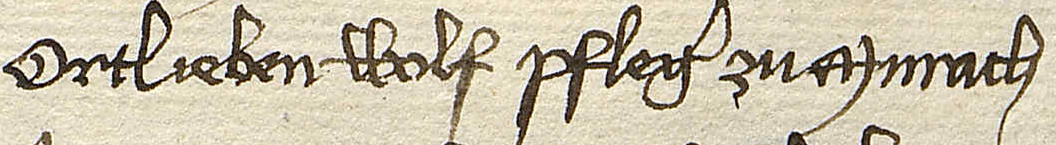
Ortlieben Wolf Pfleg* ʒu Murach
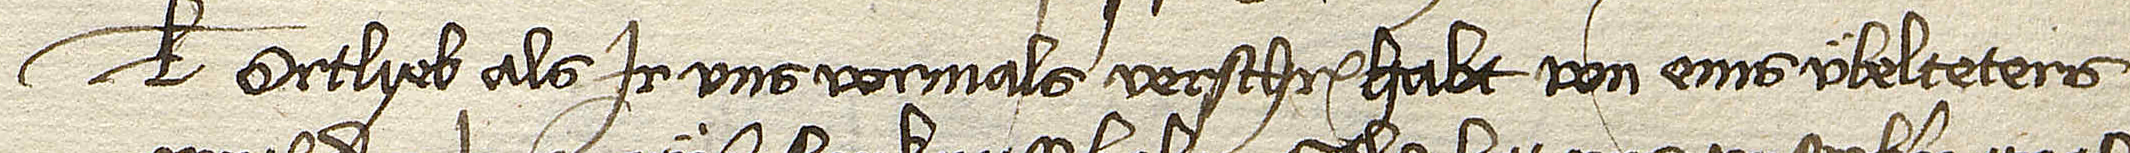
L* Ortlyeb als Ir vns vormals als verſchr* habt von eins v̈belteters
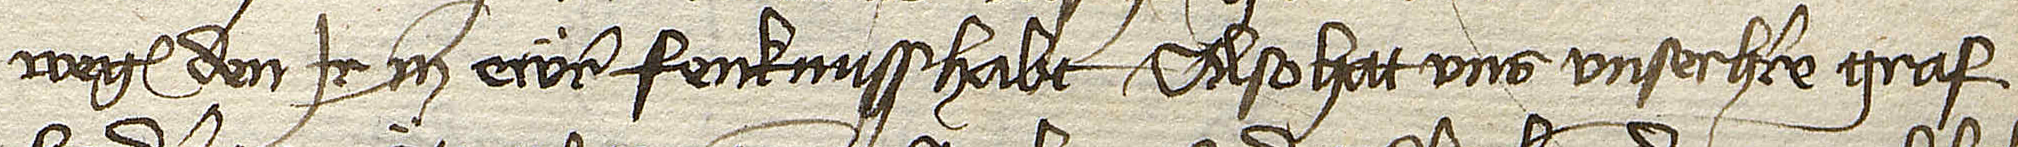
weg* den Ir in eẅr* fenknuſſ habt / Alſo hat vns vnſer h*re graf
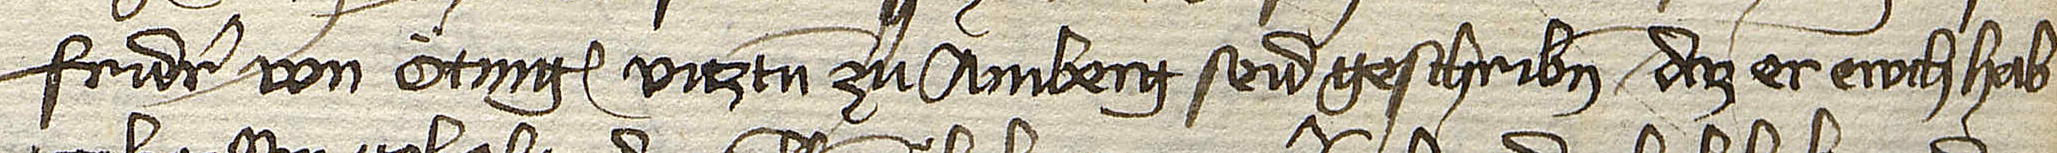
fridr* von Öting* vicʒtu* ʒu Amberg ſeid geſchribn* / daʒ er ewch hab
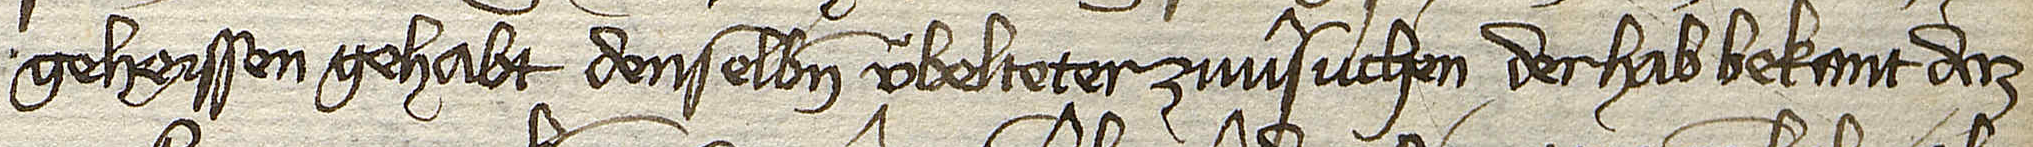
geheiſſen gehabt denſelbn* v̈belteter ʒuu*ſuchen der hab bekant daʒ
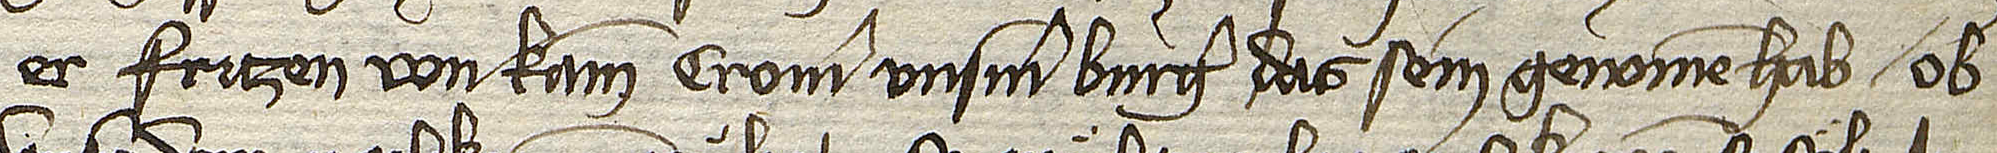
er fricʒen von kam* Crom* vnſm* burg* das ſein genome* hab / ob
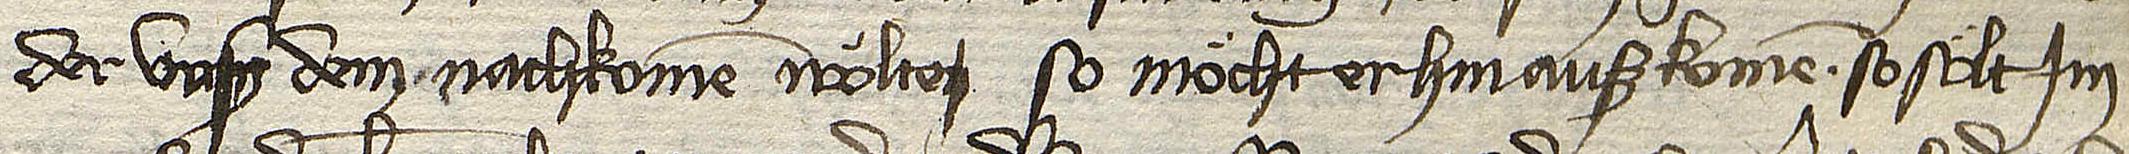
der vnſ* dem nachkome* wölten ſo möcht er hin auſʒ kome* . ſo ſölt Im
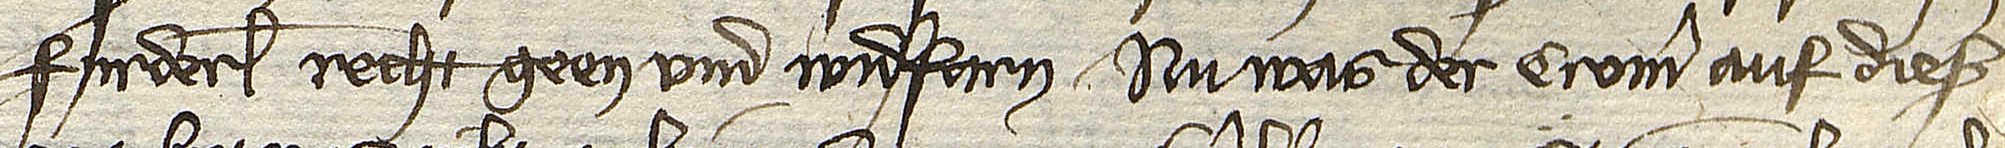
fürderl* recht geen vnd wid*farn / Nu was der Crom* auf dieſ*
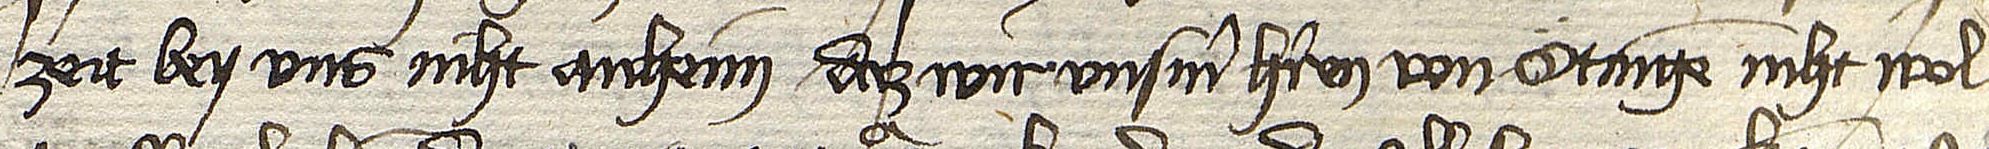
ʒeit bey vns niht anheim / daʒ wir vnſm* h*ren von Ötinge* niht wol
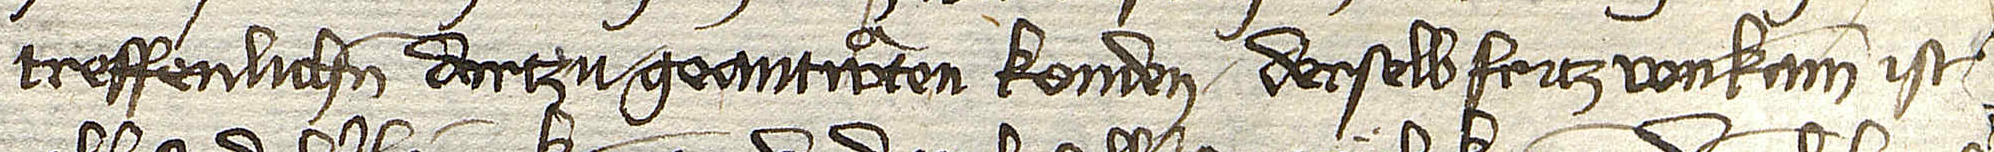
treffenlich*n darcʒu geantw*ten konden / Derſelb fricʒ von kam* iſt
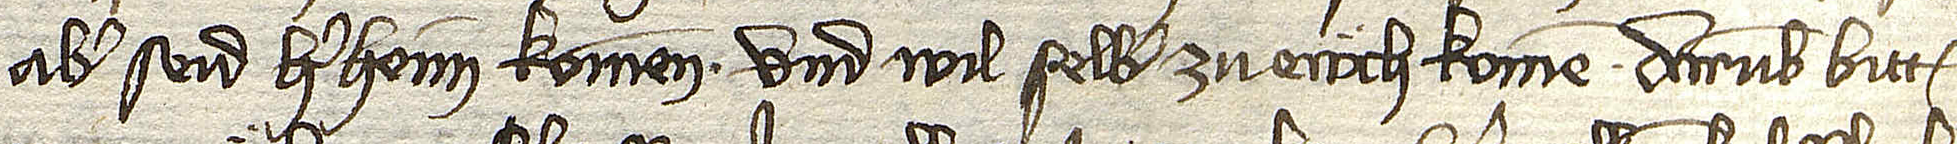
ab* ſeid h*heim kom*en . Vnd wil ſelb* ʒu eẅch kome* . darub* bitt*
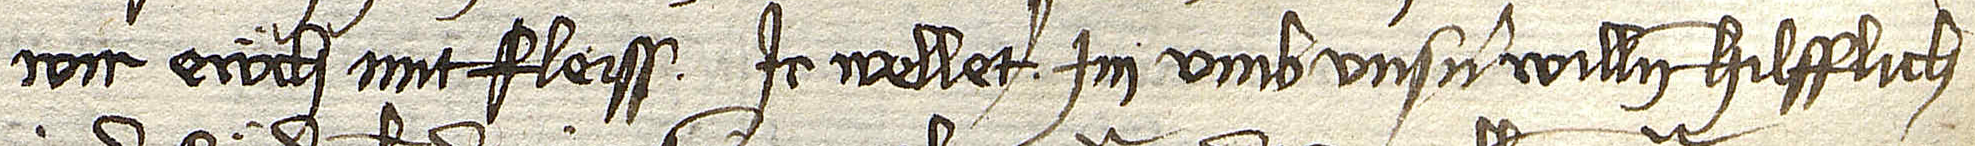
wir eẅch mit fleiſſ . Ir wellet Im vmb vnſn* willn* hilfflich
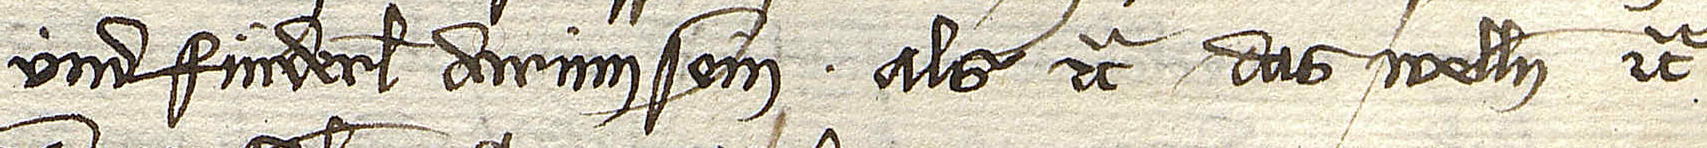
vnd fürderl* darinn ſein . als ec* / das welln* ec*
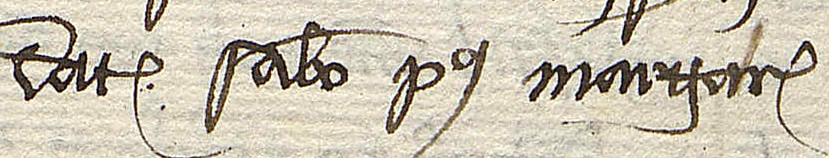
Dat* ſab*o p* margar*
